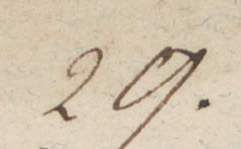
29.
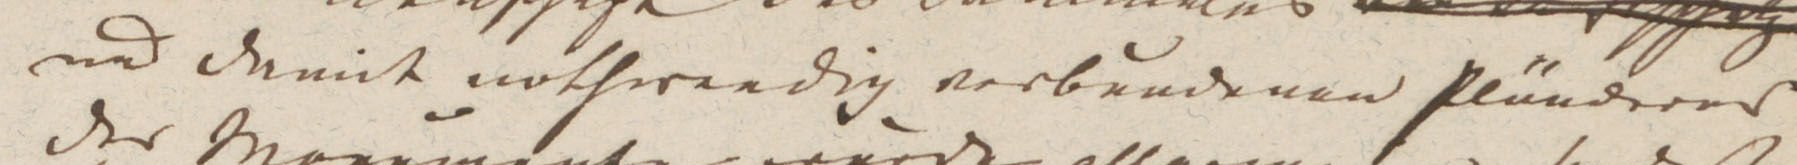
und damit nothwendig verbundenen Plünderns
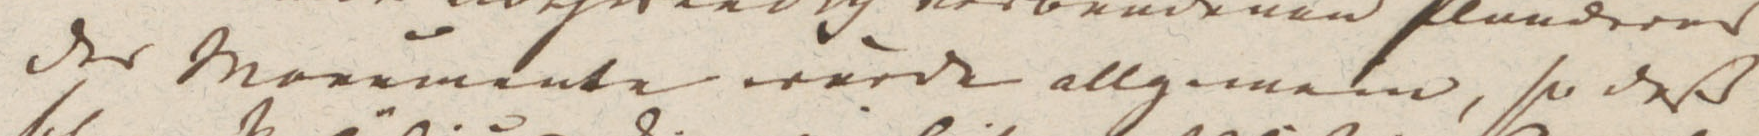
der Monumente wurde allgemein, so dass
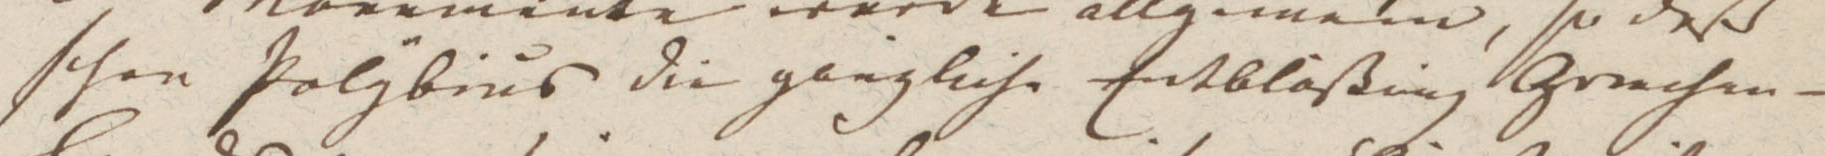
schon Polybius die gänzliche Entblössung Griechen-
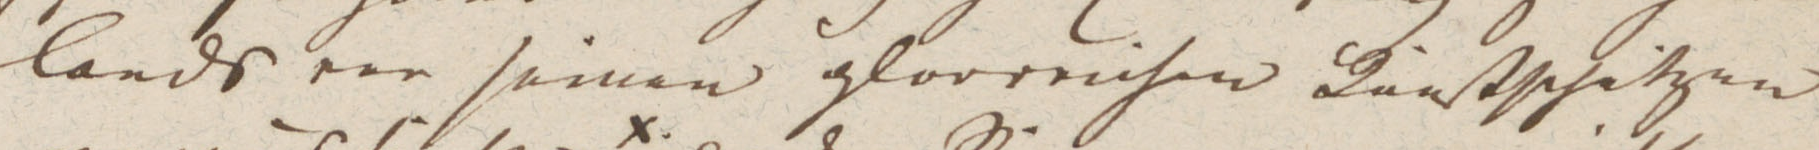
lands von seinen glorreichen Kunstschätzen
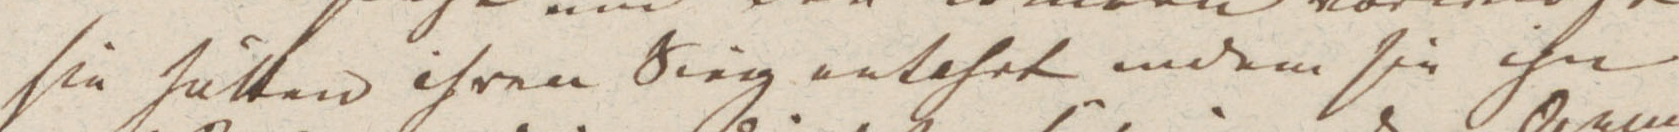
sie hätten ihren Sieg entehrt indem sie ihn
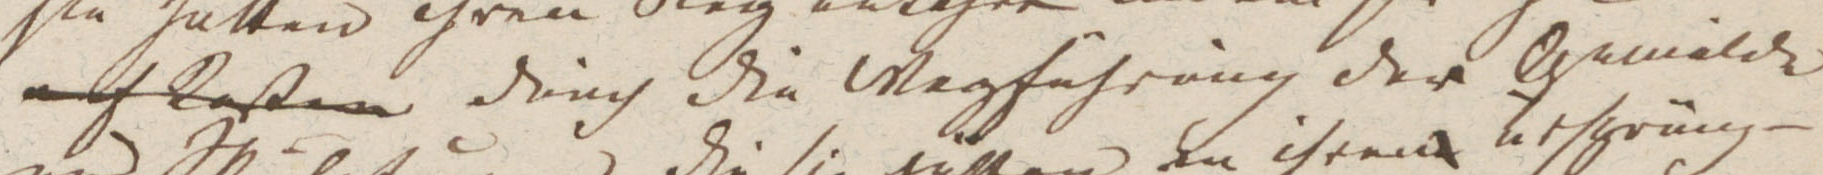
auf Kosten durch die Wegführung der Gemälde
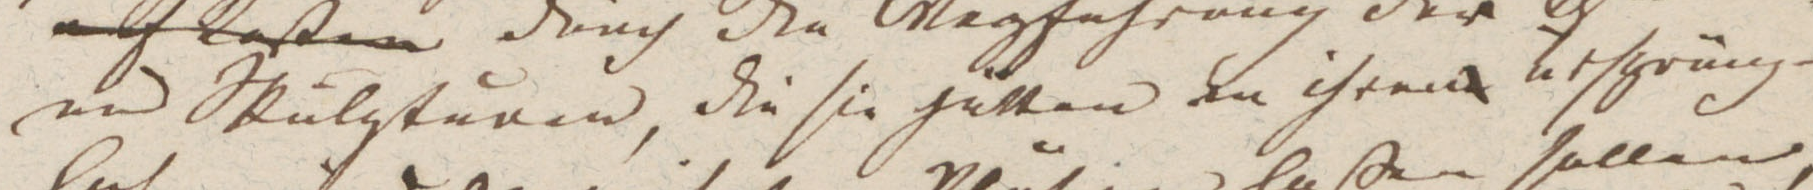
und Skulpturen, die sie hätten an ihremn ursprüng-
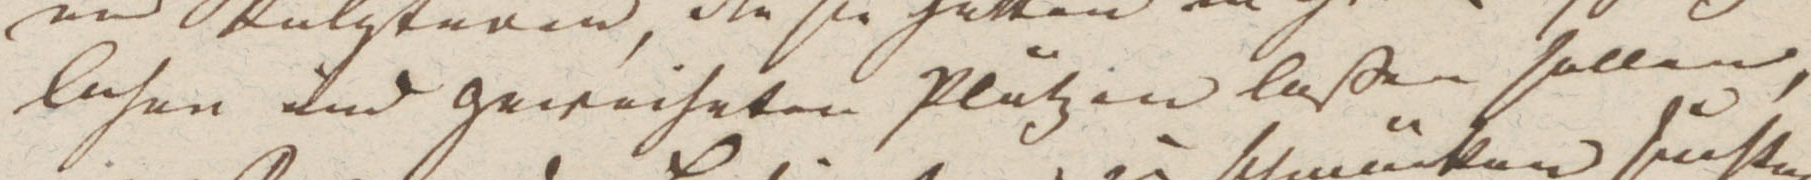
lichen und geweiheten Plätzen lassen sollen,
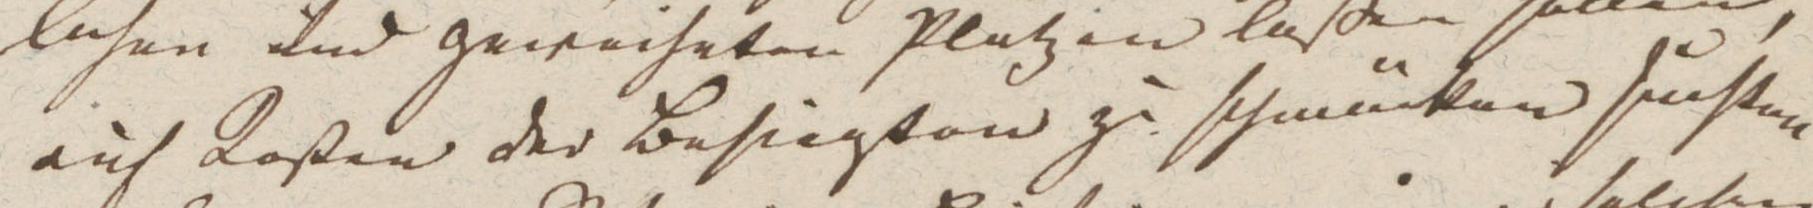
auf Kosten der Besiegten zu schmücken suchten.
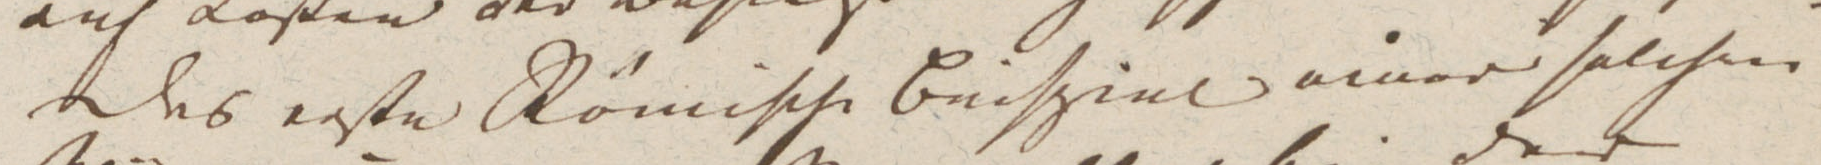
Das erste Römische Beispiel einer solchen
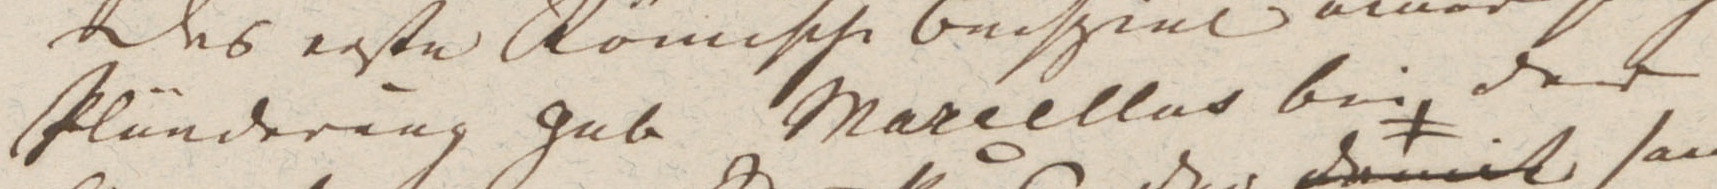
Plünderung gab Marcellus bei der
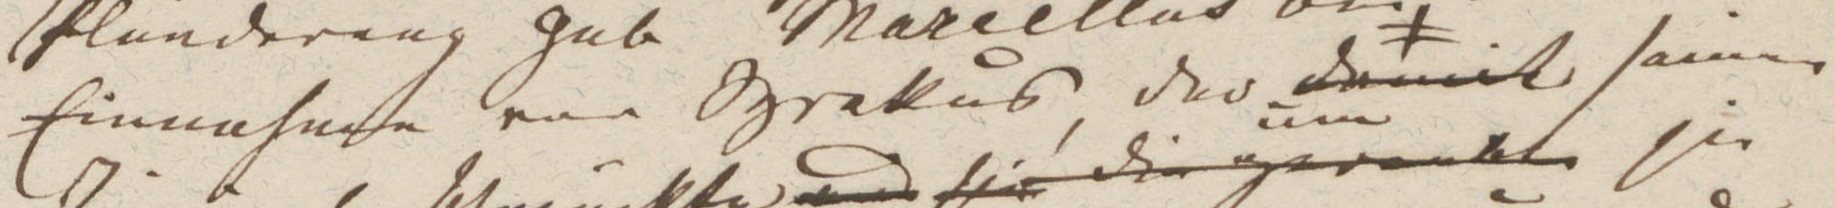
Einnahme von Syrakus, der damit % seinen
